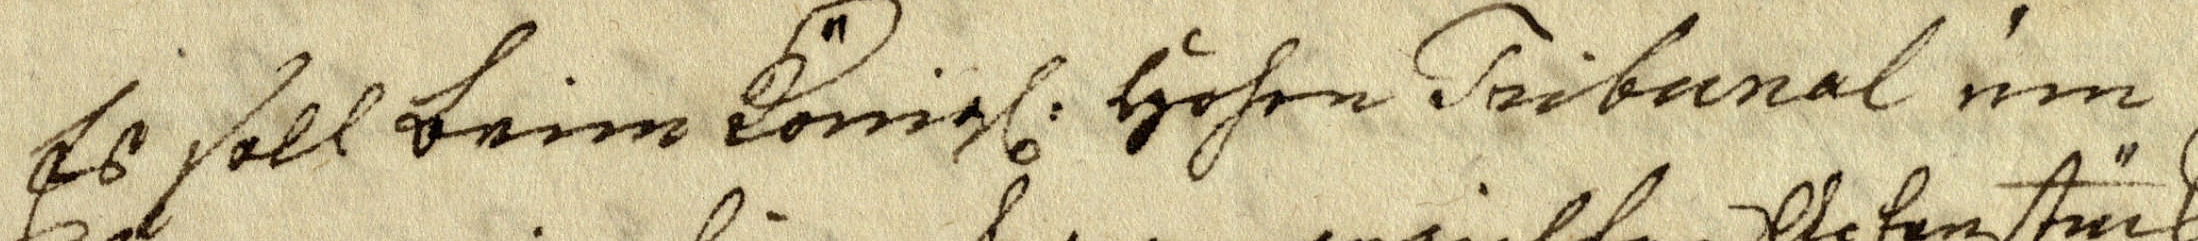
Es soll beim Königl. Hohen Tribunal um
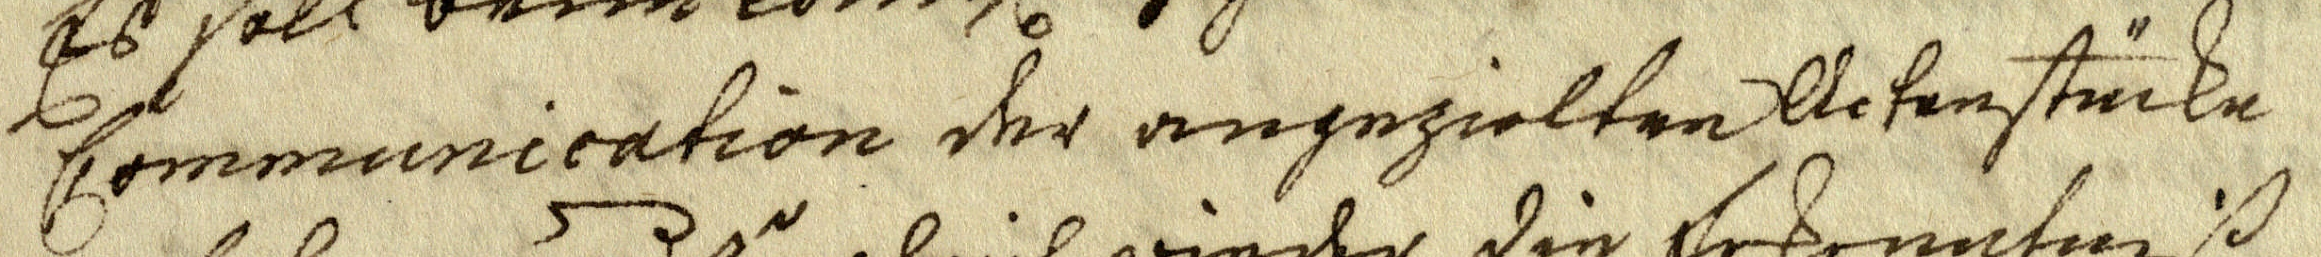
Communication der angezielten Actenstücke
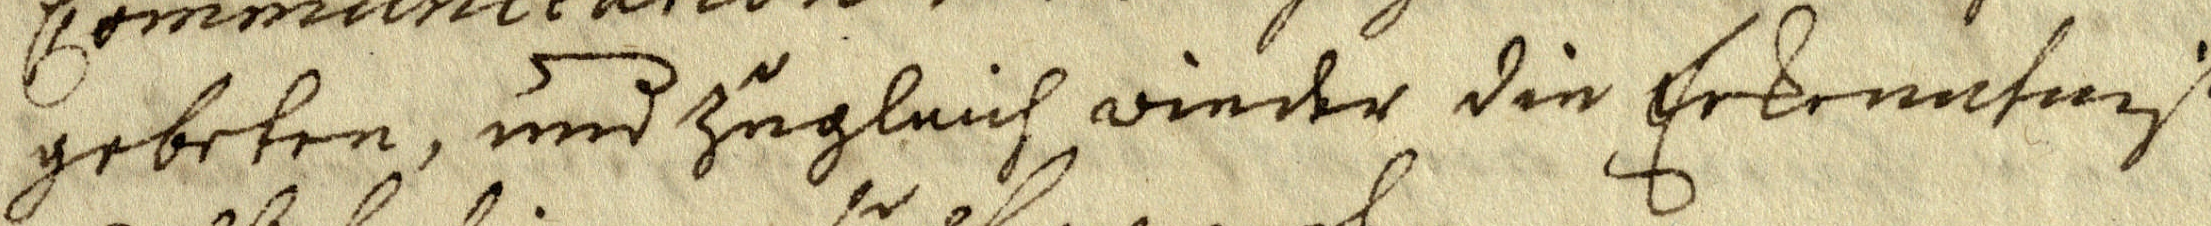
gebeten, und zugleich wieder die Erkenntniß
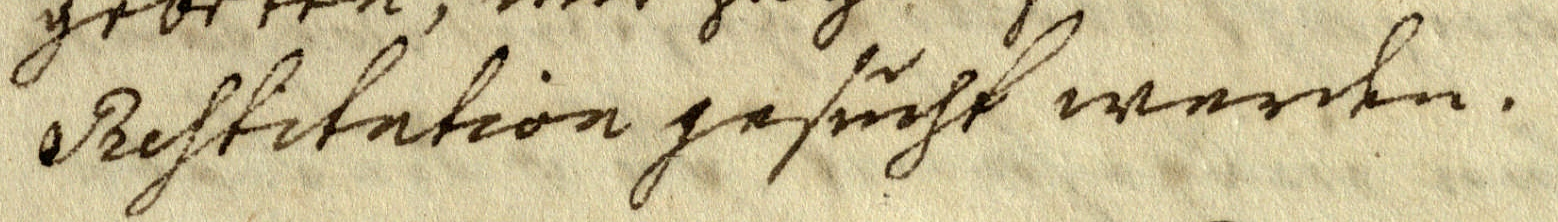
Restitution gesucht werden.
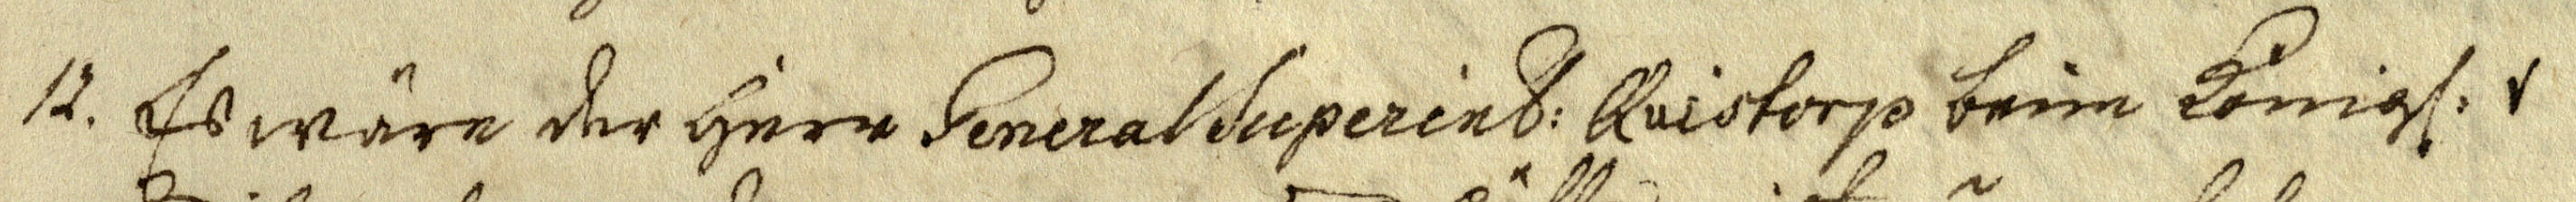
12. Es wäre der Herr GeneralSuperint. Quistorp beim Königl.
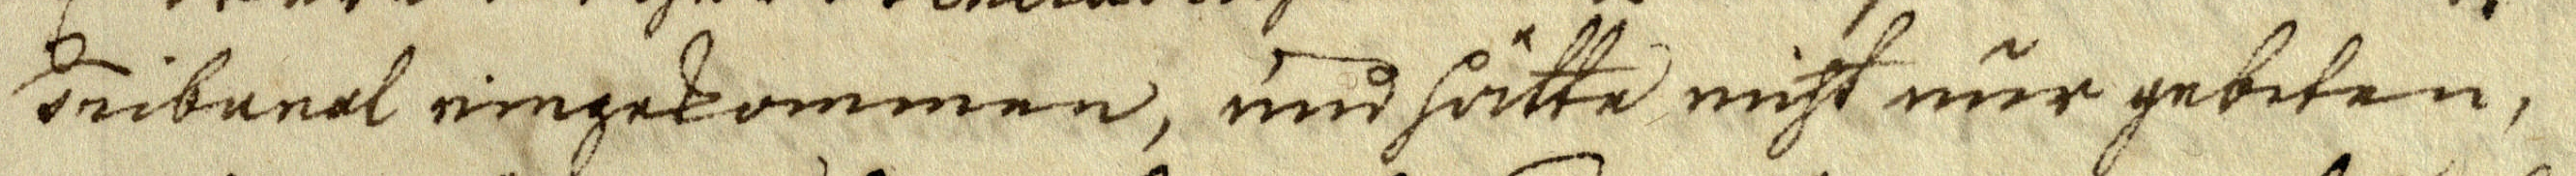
Tribunal aingekommen, und hätte nicht nur gebeten,
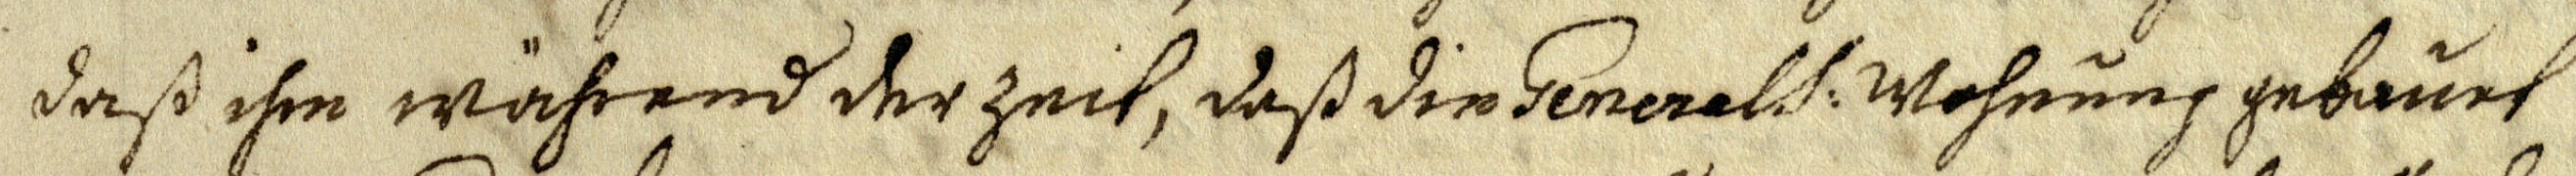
daß ihm während der Zeit, daß die GeneralS. Wohnung gebauet
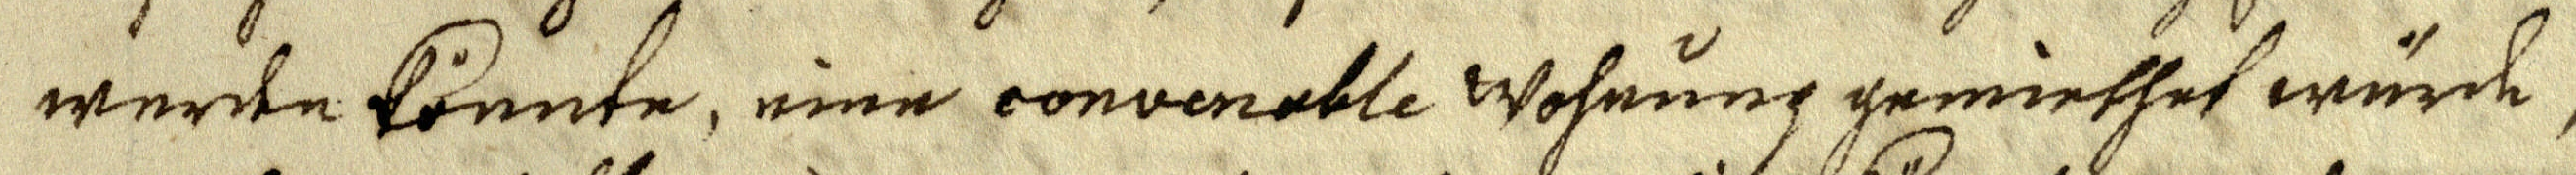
werden könnte, eine convenable Wohnung gemiethet würde,
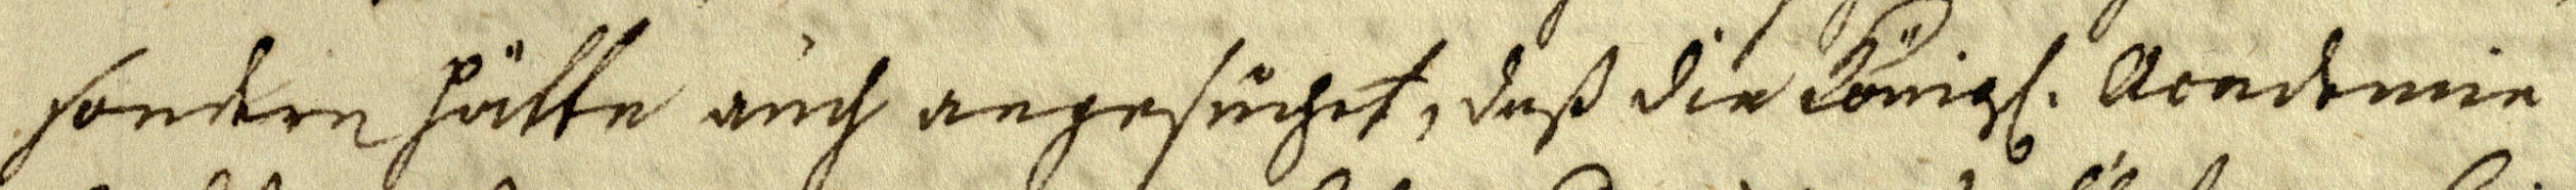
sondern hätte auch angesuchet, daß die Königl. Academie
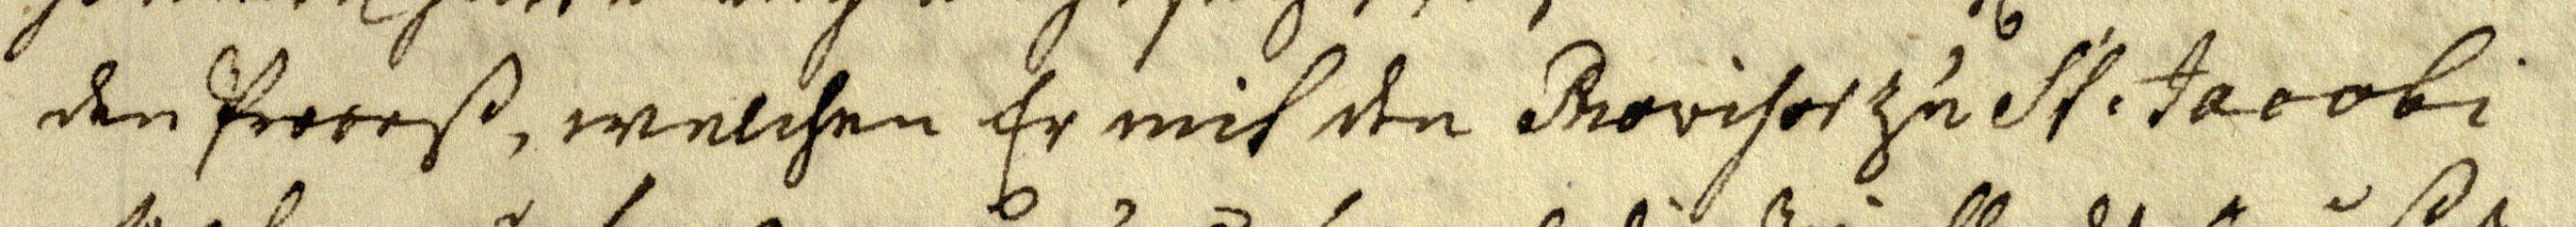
den Proceß, welchen Er mit dem Provisor zu St. Jacobi
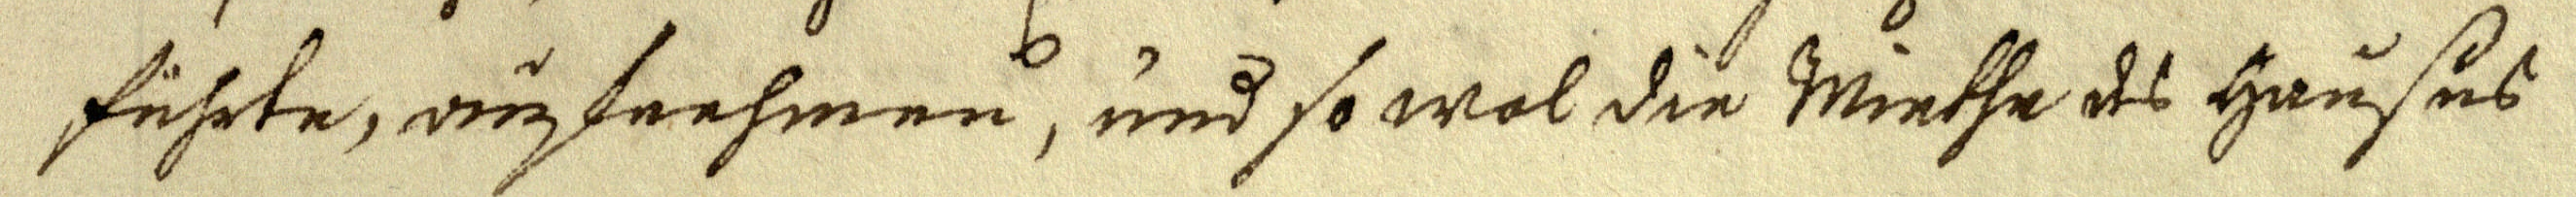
führte, aufnehmen, und so wol die Miethe des Hauses
